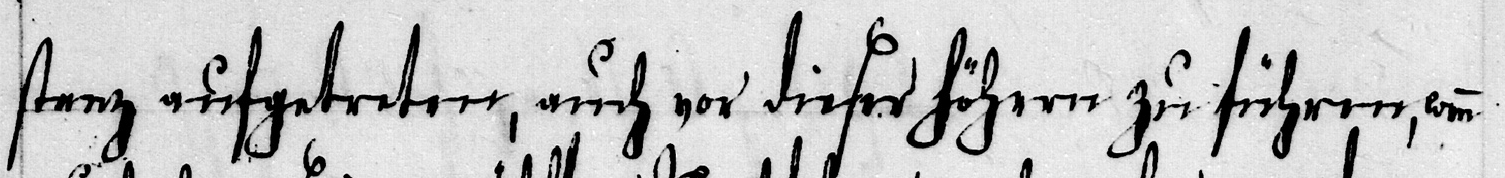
stanz aufgetreten, auch vor dieser Höhern zu führen, we¬
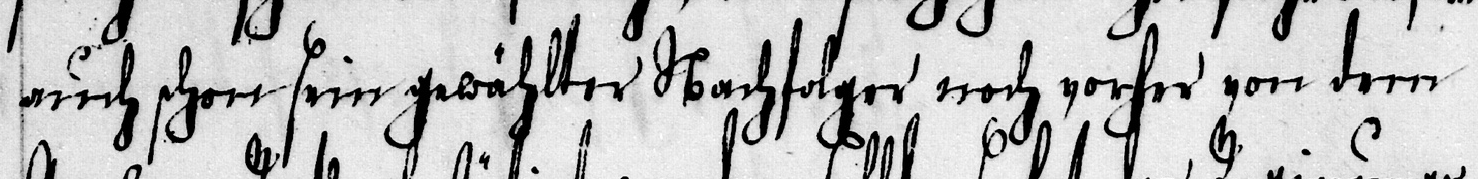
auch schon sein gewählter Nachfolger noch vorher von dem
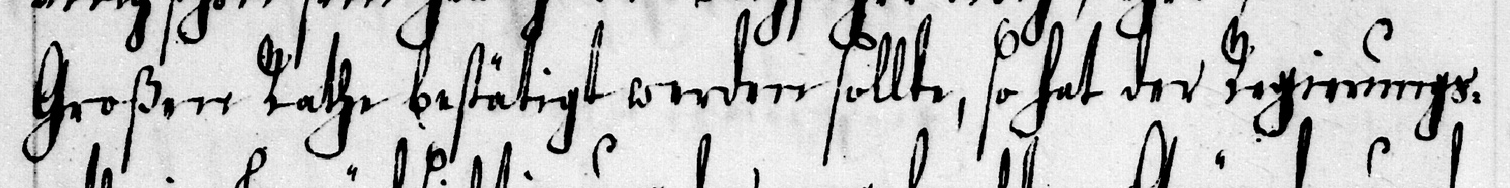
Großen Rathe bestätigt werden sollte, so hat der Regierungs¬
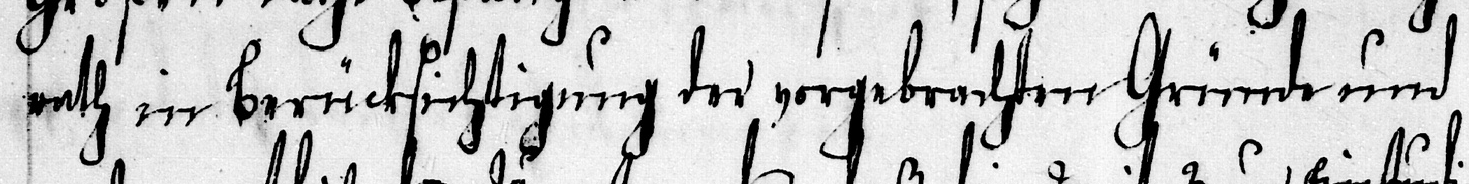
rath in Berücksichtigung der vorgebrachten Gründe und
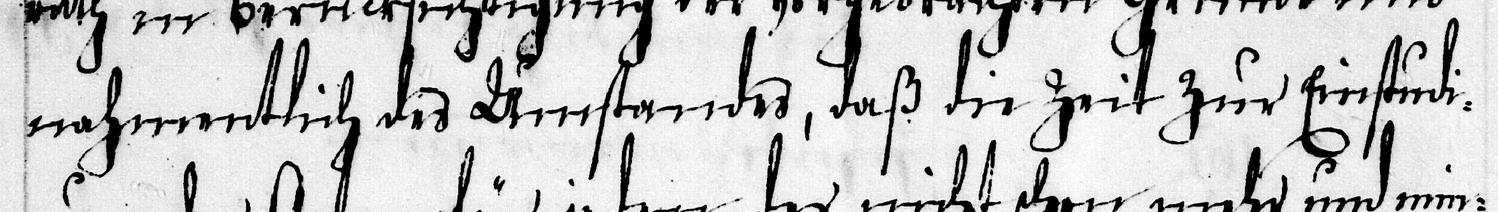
nahmentlich des Umstandes, daß die Zeit zur Einstudi¬
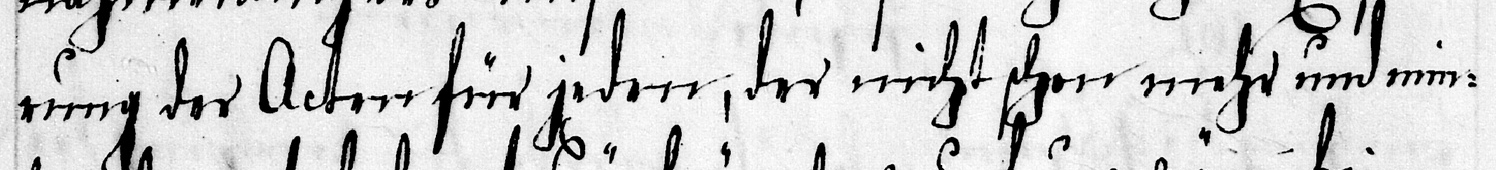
rung der Acten für jeden, der nicht schon mehr und min¬
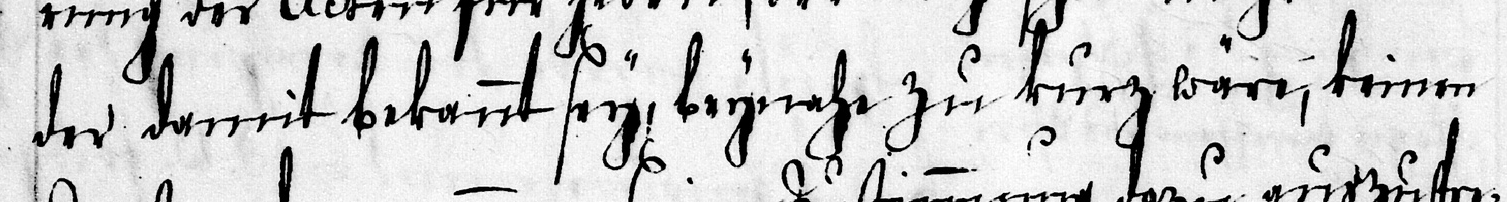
der damit bekannt sey, beynahe zu kurz wäre, keinen
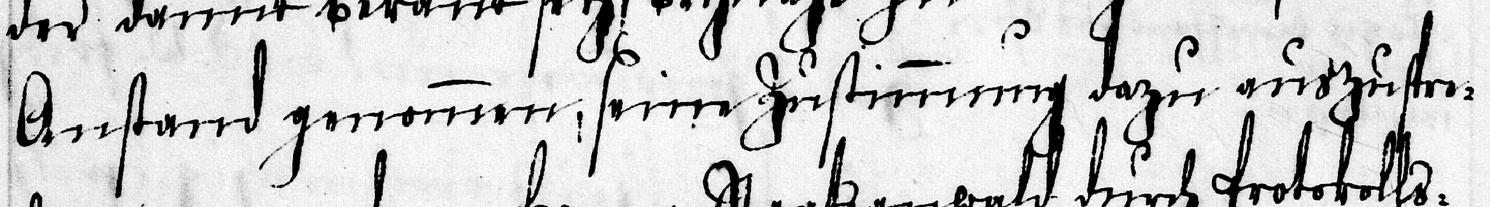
Anstand genommen, seine Zustimmung dazu auszuspre¬
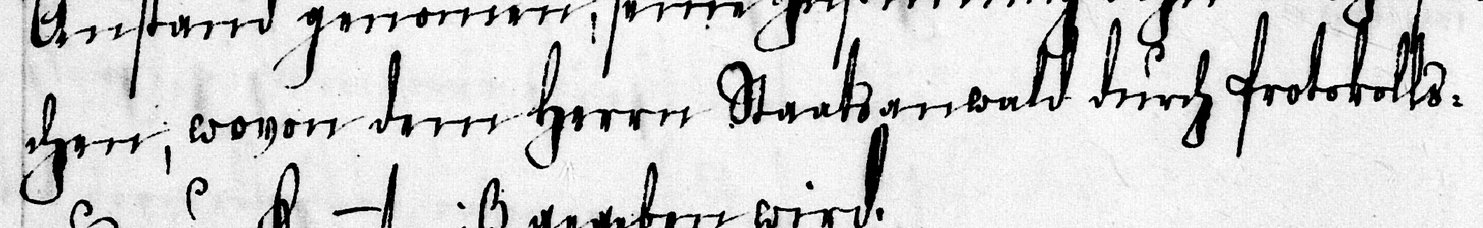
chen, wovon dem Herrn Staatsanwald durch Protokolls¬
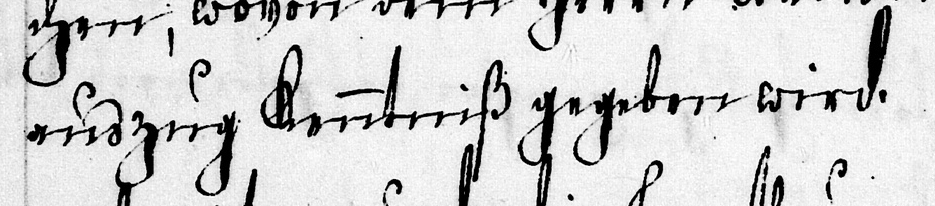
auszug Kenntniß gegeben wird.
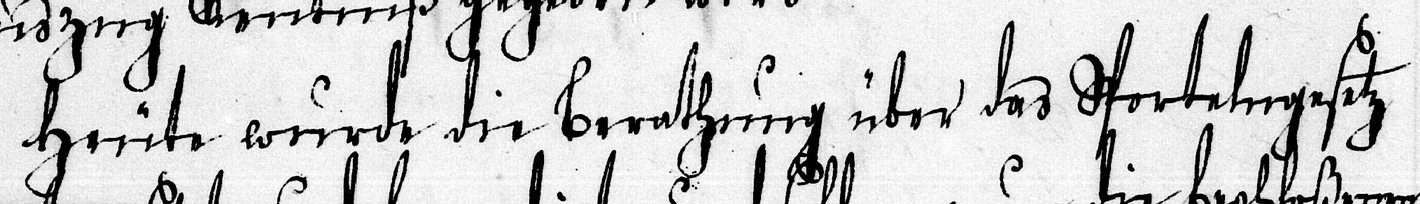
Heute wurde die Berathung über das Sportelngesetz
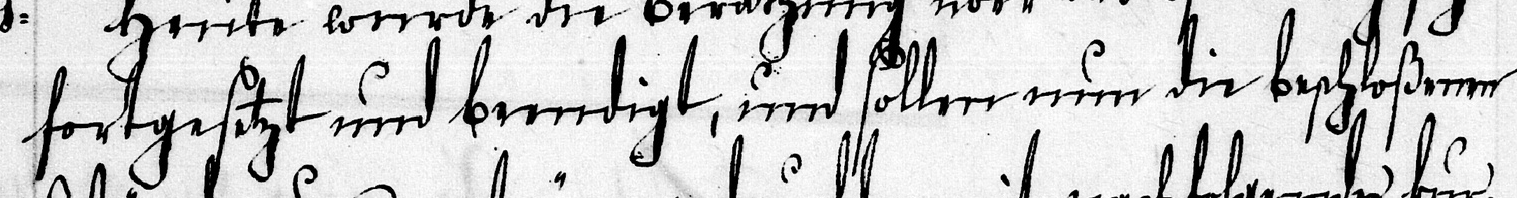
fortgesetzt und beendigt, und sollen nun die beschloßenen
